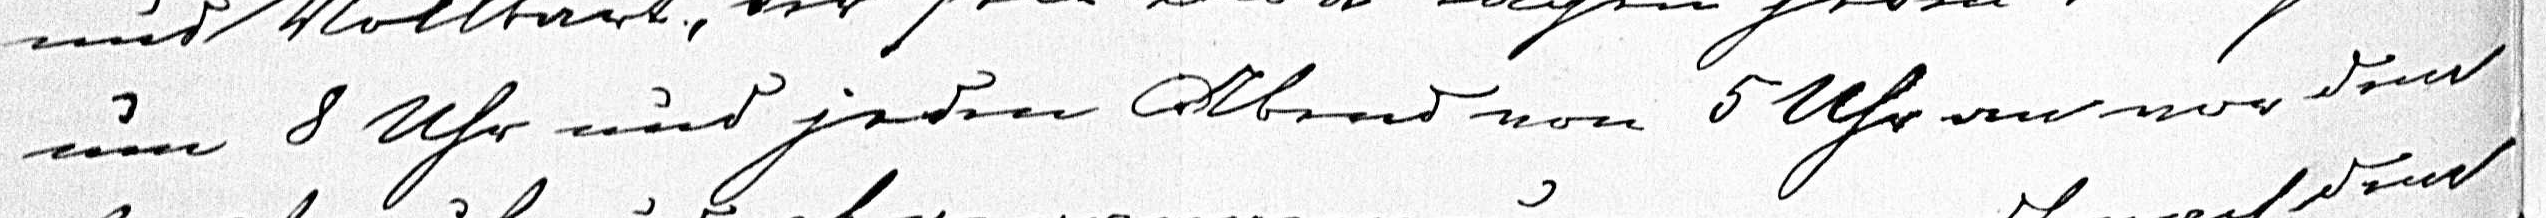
um 8 Uhr und jeden Abend von 5 Uhr an vor dem
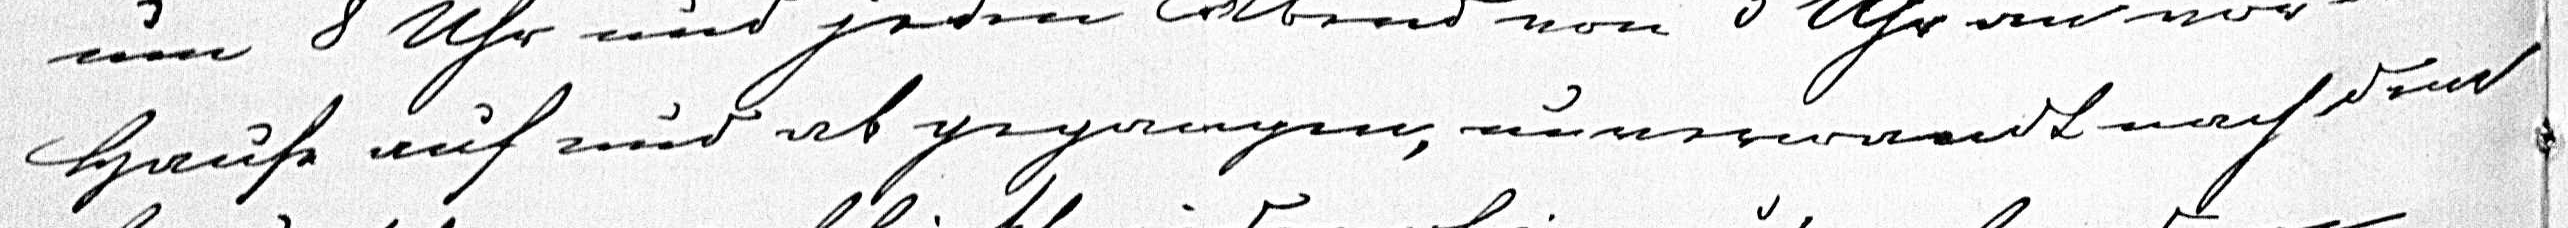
Hause auf und ab gegangen, unverwandt nach dem
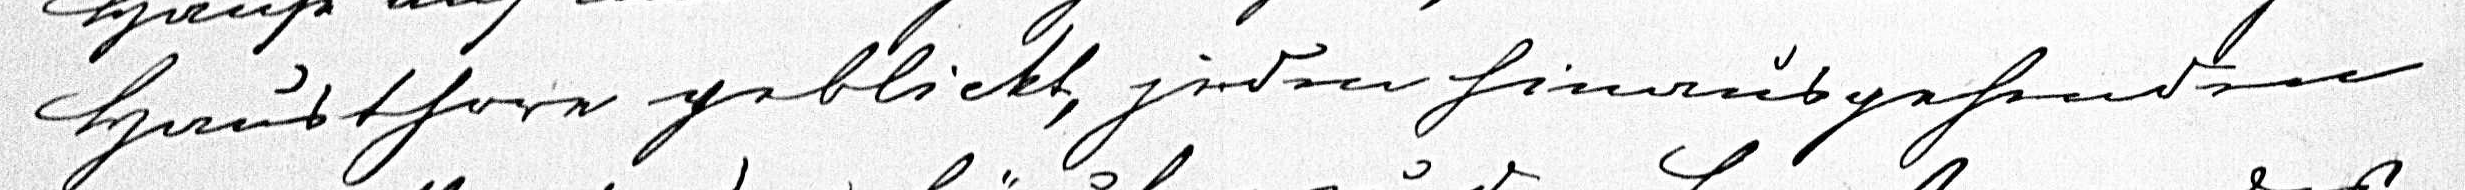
Hausthore geblickt, jeden hinausgehenden
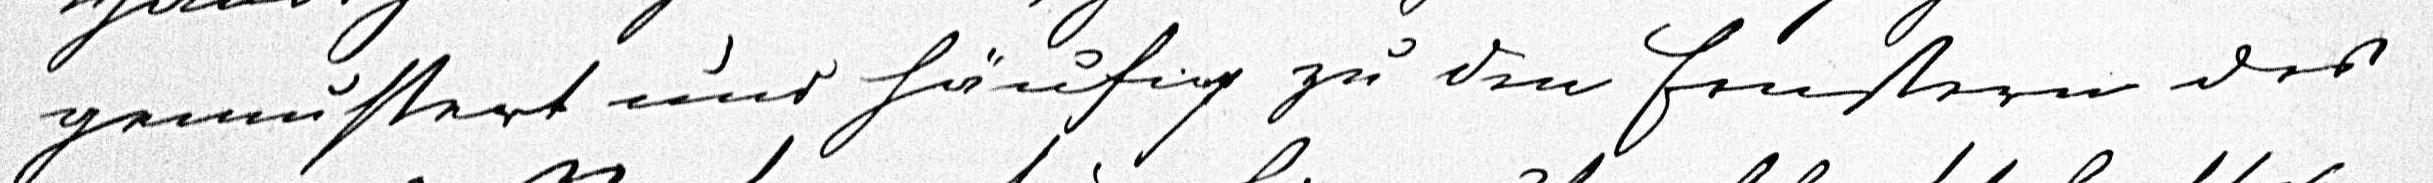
gemustert und häufig zu den Fenstern des
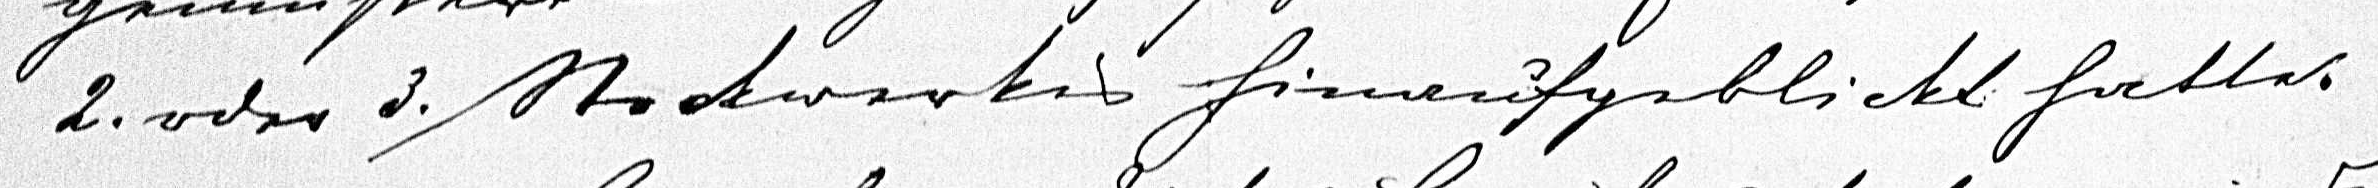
2. oder 3. Stockwerkes hinaufgeblickt hatte.
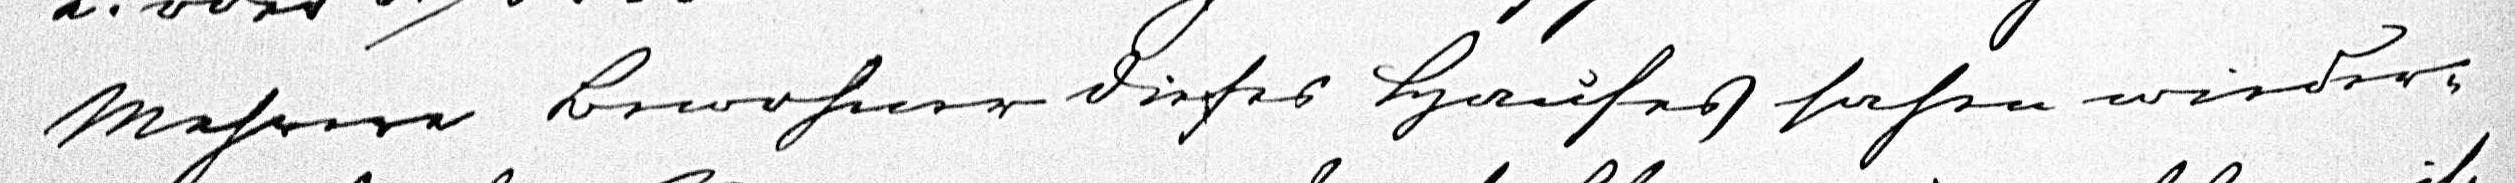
Mehrere Bewohner dieses Hauses sahen wieder¬
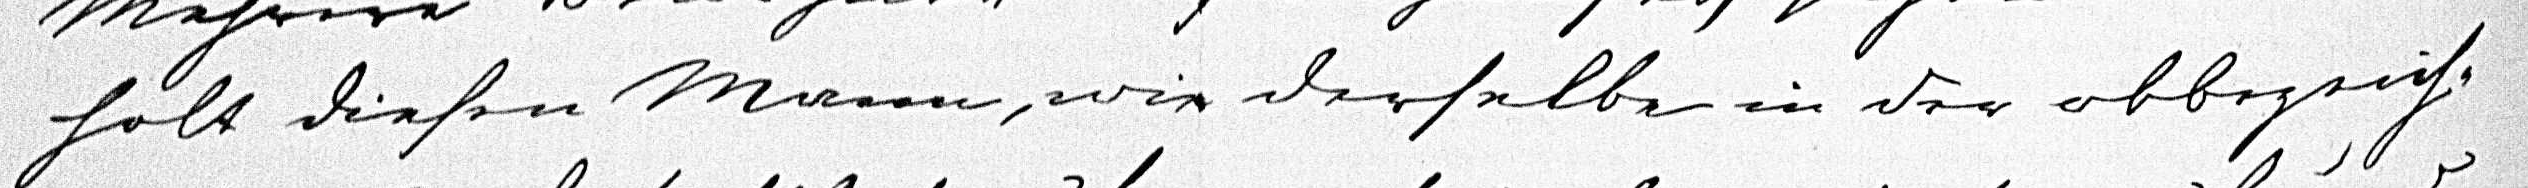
holt diesen Mann, wie derselbe in der obbezeich¬
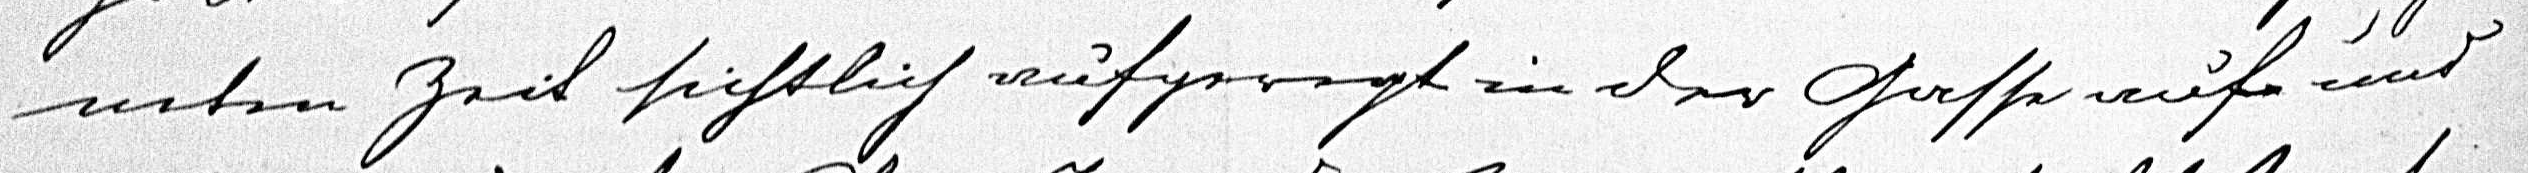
neten Zeit sichtlich aufgeregt in er Gasse auf und
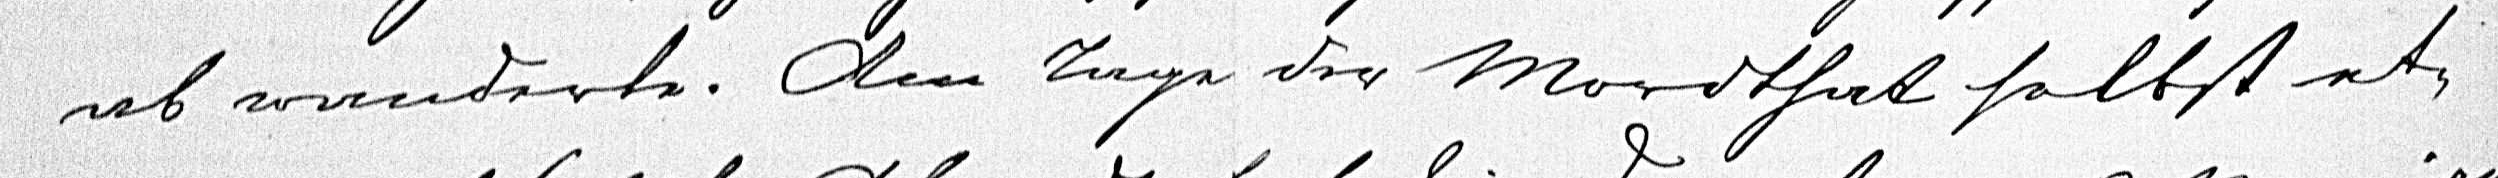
ab wanderte. Am Tage der Mordthat selbst et¬
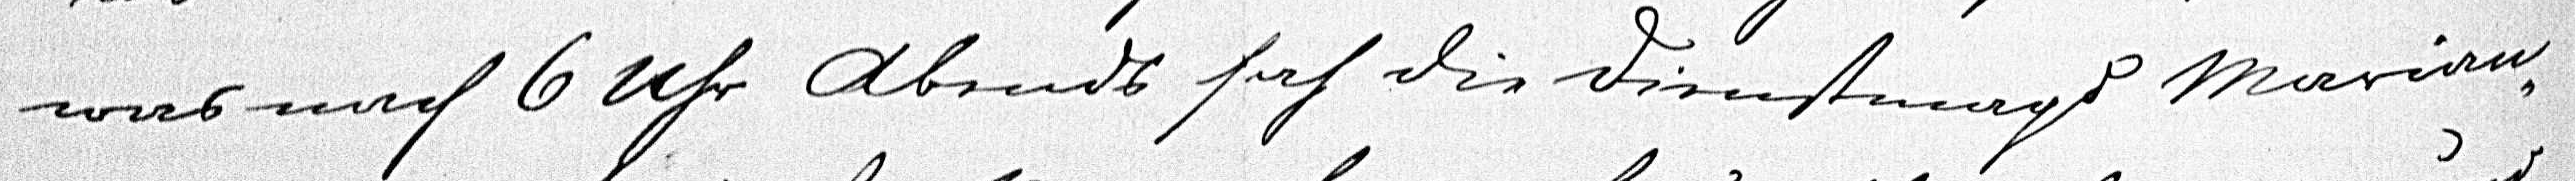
was nach 6 Uhr Abends sah die Dienstmagd Marian¬
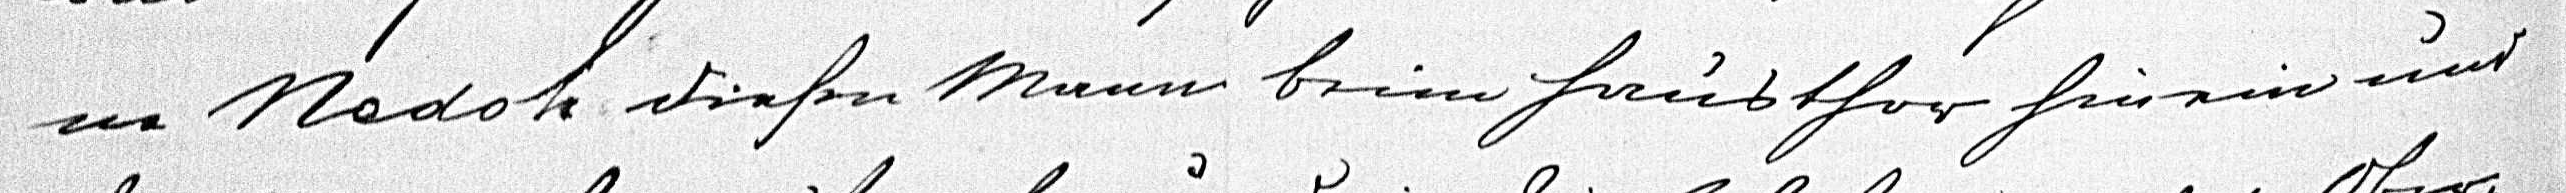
ne Nodol [?Nodok?] diesen Mann beim Hausthor hinein und
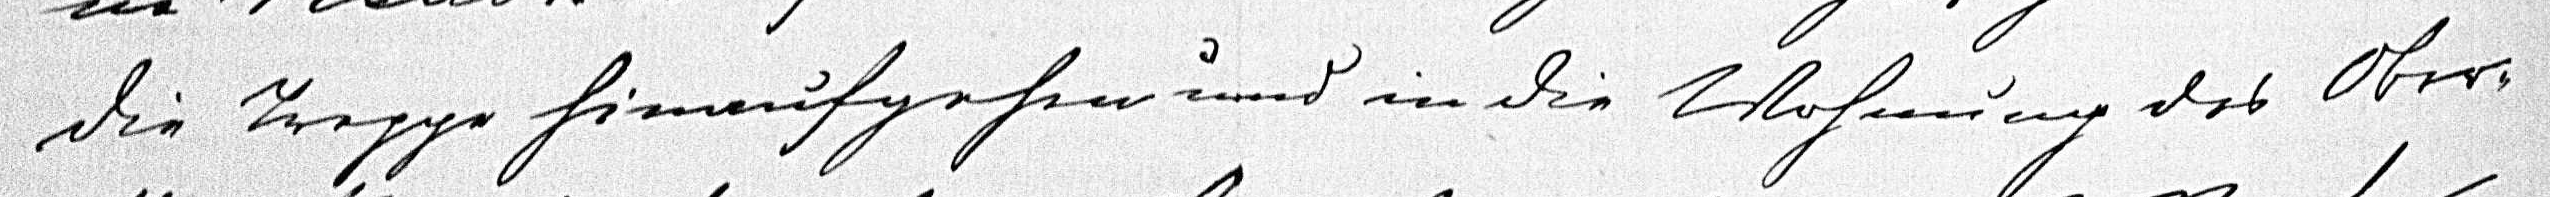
die Treppe hinaufgehen und in die Wohnung des Ober¬
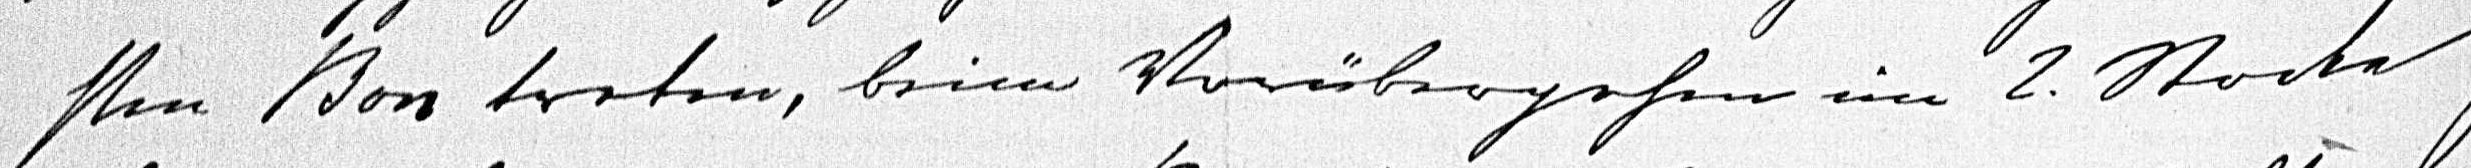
sten Bon treten, beim Vorübergehen im 2. Stocke
